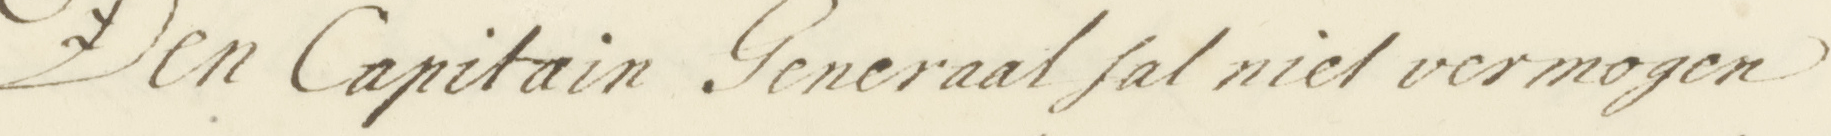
Den Capitain Generaal sal niet vermogen
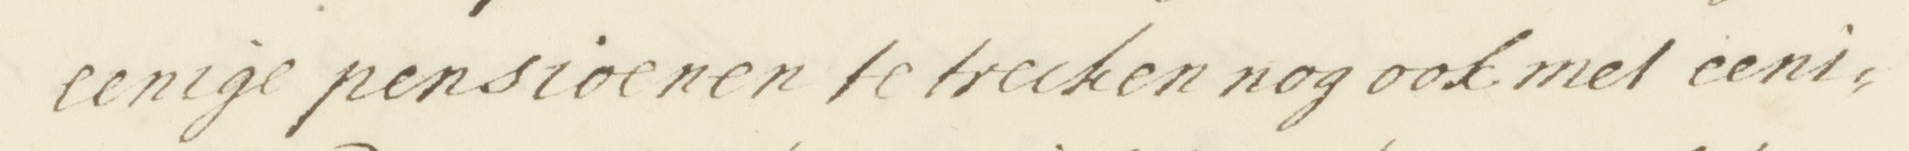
eenige pensioenen te trecken nog ook met eeni„
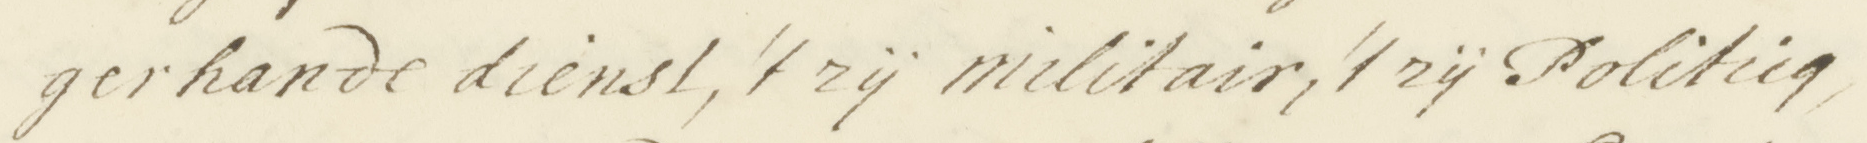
gerhande dienst, 't zij militair, 't zij Politieq,
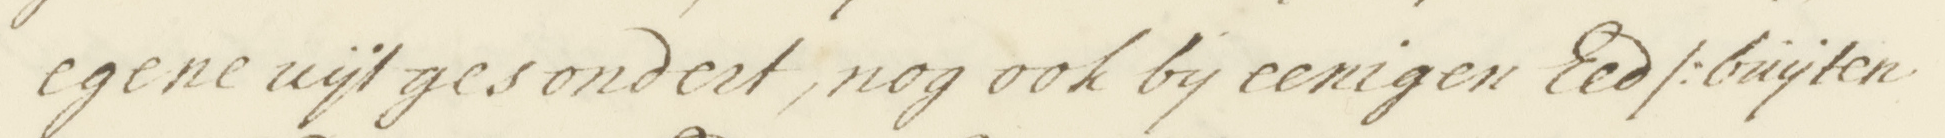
egene uijtgesondert, nog ook bij eenigen Eed (: buijten
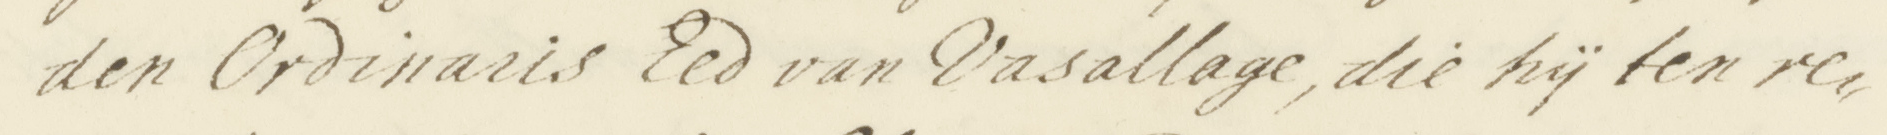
den Ordinaris Eed van Vasallage, die hij ten re„
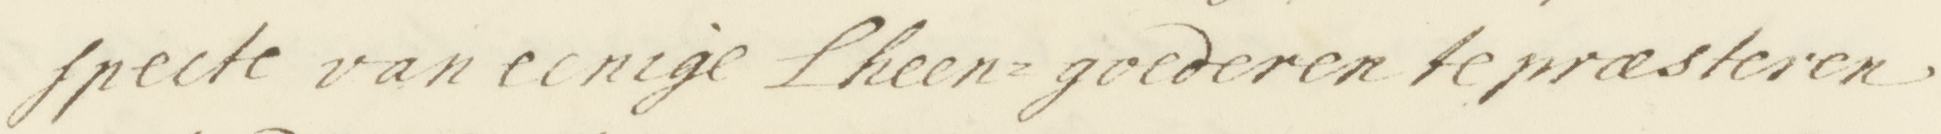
specte van eenige Lheen=goederen te presteren
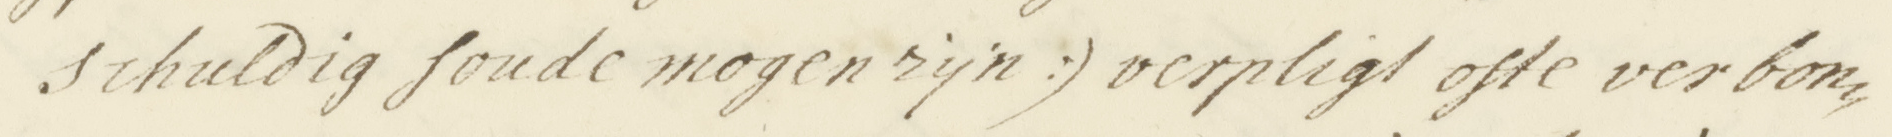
schuldig soude mogen zijn :) verpligt ofte verbon„
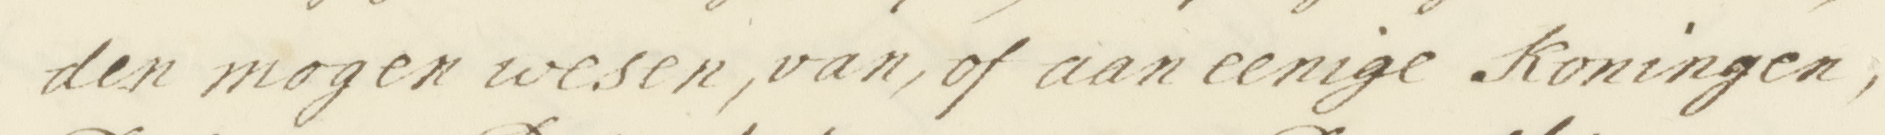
den mogen wesen van, of aan eenige Koningen,
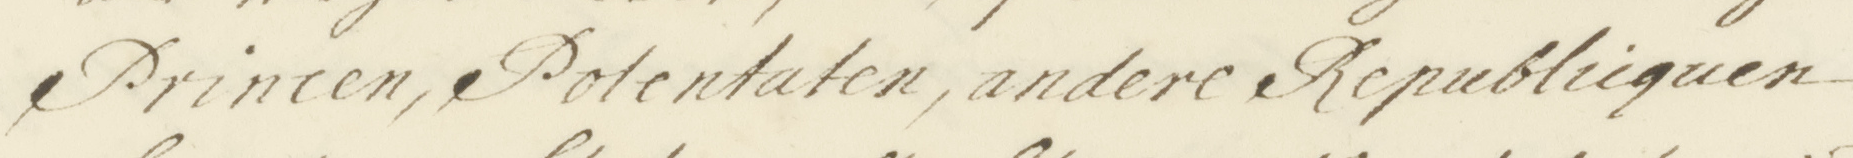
Princen, Potentaten, andere Republiequen
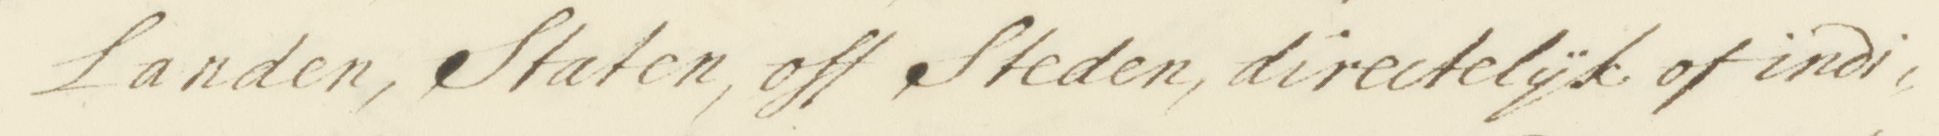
Landen, Staten, off Steden, directelijk of indi,,
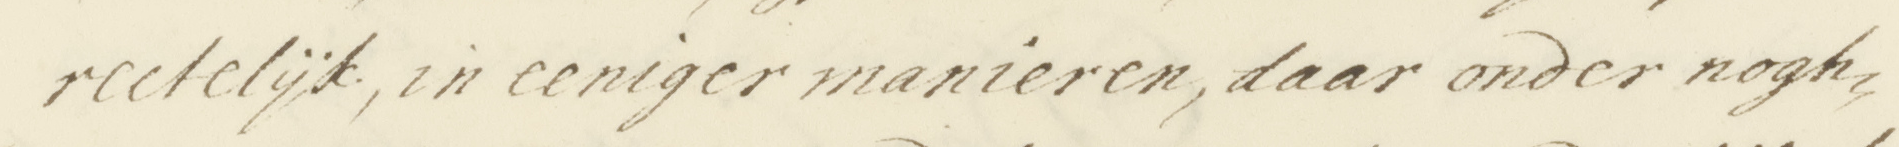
rectelijk, in eeniger manieren, daar onder nogh„
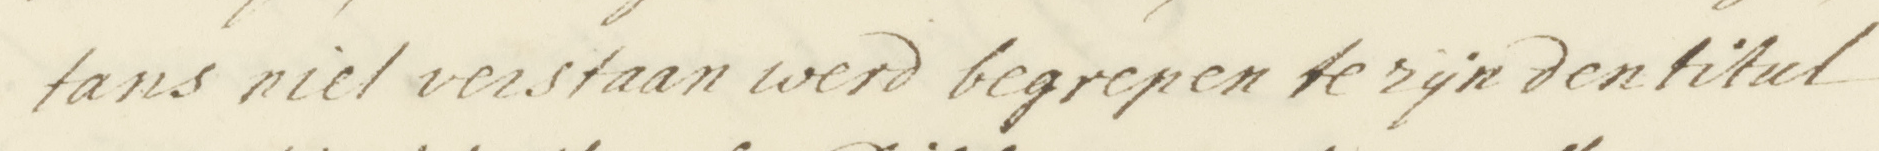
tans niet verstaan werd begrepen te zijn den titel
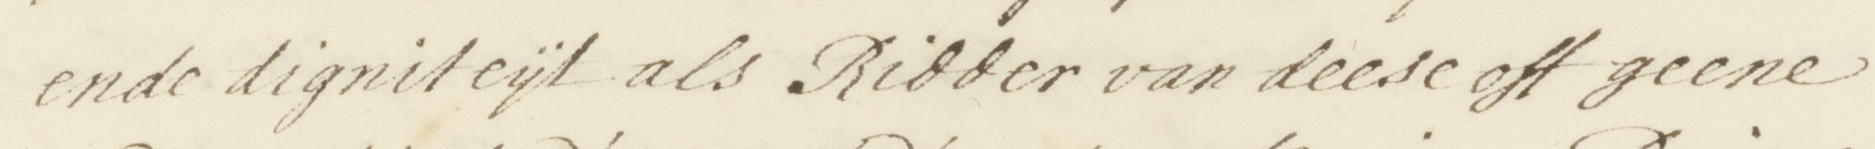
ende digniteijt als Ridder van deese off geene
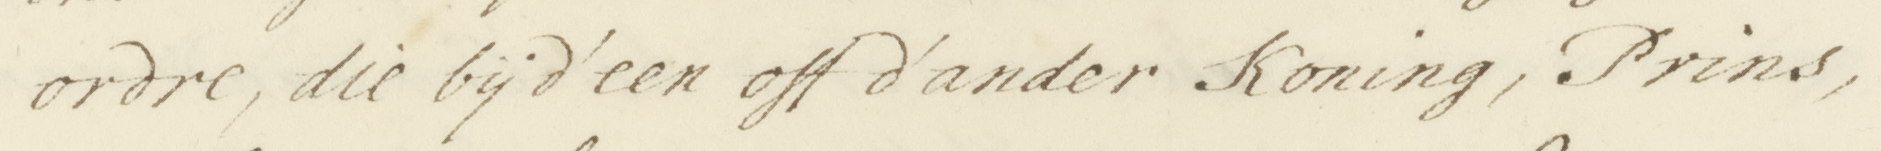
ordre, die bij d'een oft d'ander Koning, Prins,
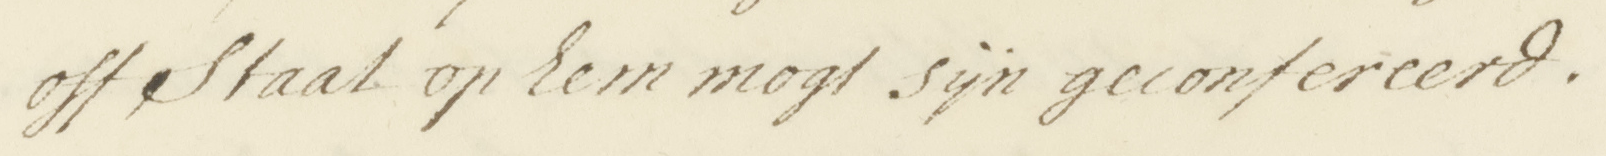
oft Staat op hem mogt sijn gecontereerd.
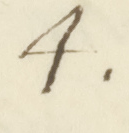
4.
